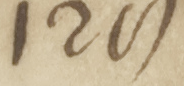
128
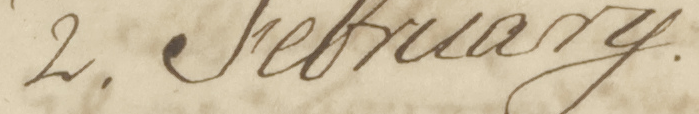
2. Februarij.
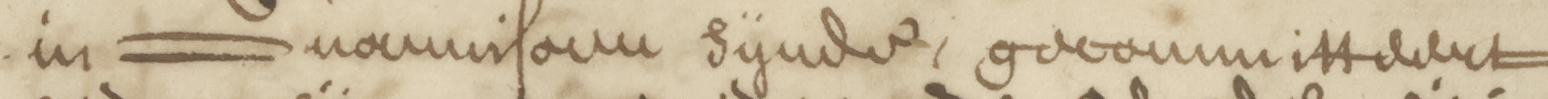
in Guarnisoen sijnde, gecommitteert
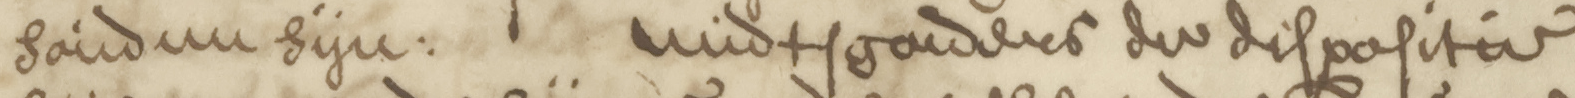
souden sijn: midtsgaders de dispositie
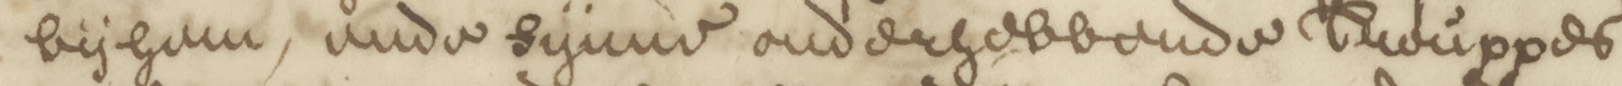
bij hem, ende sijne onderhebbende Trouppes
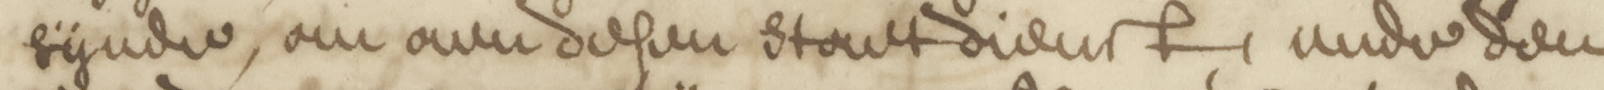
sijnde, om aen desen staet dienst, ende den
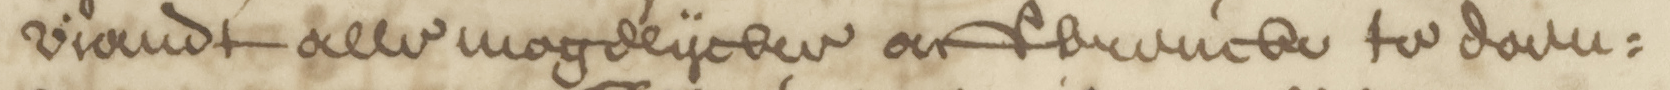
viandt alle mogelijcke affbreuck te doen:
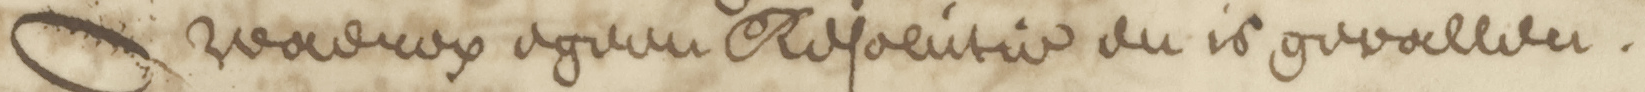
O waerop egeen Resolutie en is gevallen.
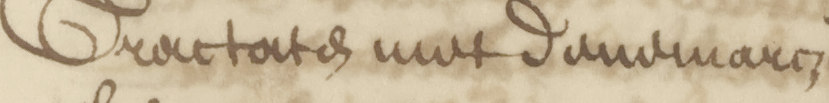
Tractaten met Denemarc,,
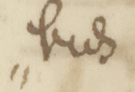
„ken
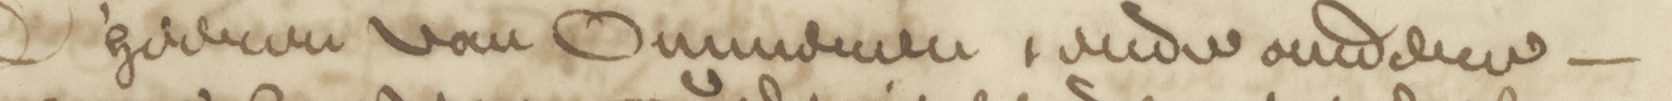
D 'heeren van Ommeren ende andere —
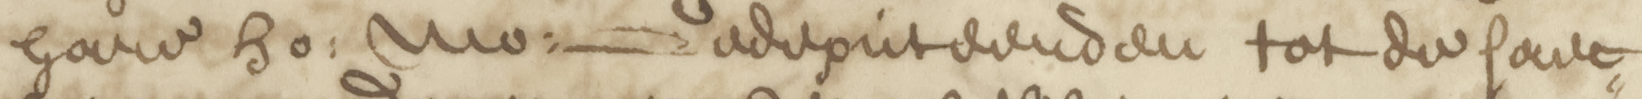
hare ho:Mo: Gedeputeerden tot de saec„
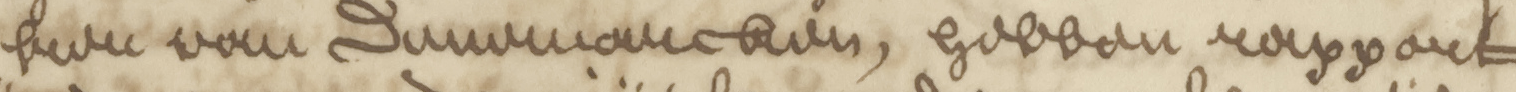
ken van Denemarcken, hebben rapport
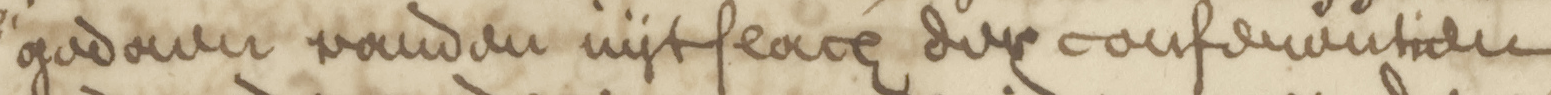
gedaen vanden uijtslach der conferentien,
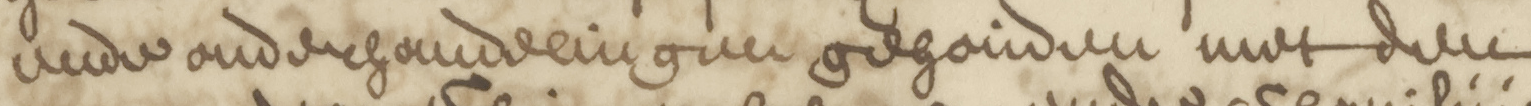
ende onderhandelingen gehouden met den
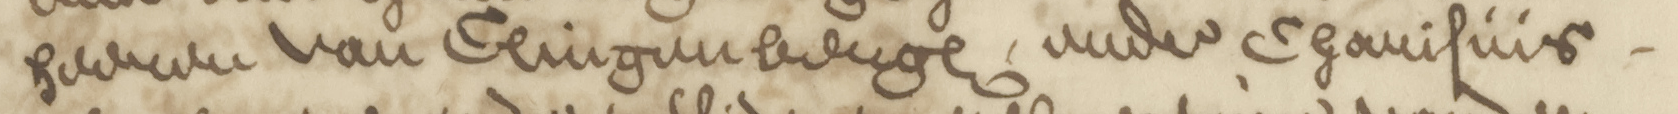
heeren van Clingenbergh, ende Charisius -
